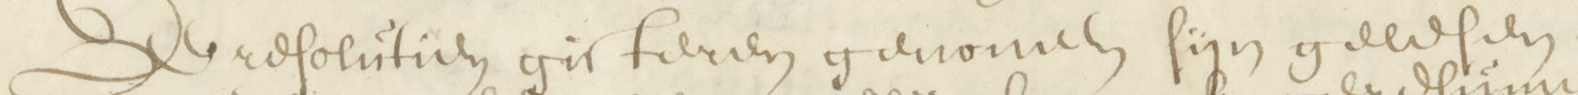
D'resolutien gisteren genomen sijn gelesen
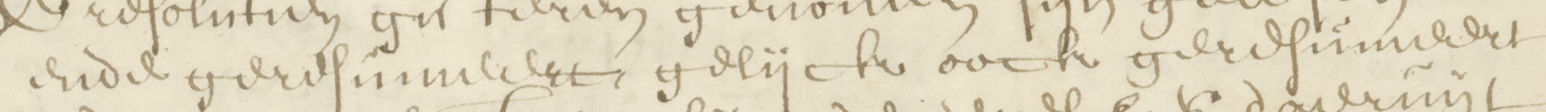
ende geresumeert, gelijck oock geresumeert
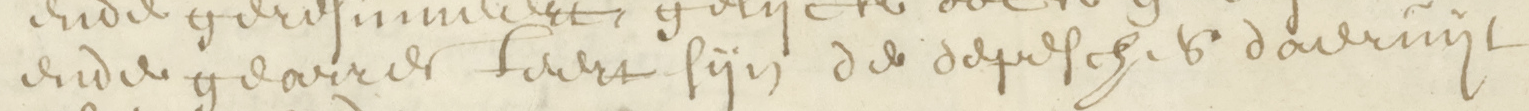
ende gearresteert sijn de depesches daeruijt
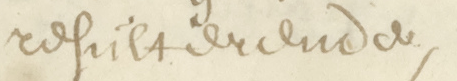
resulterende.
